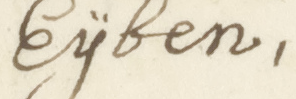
Eijben.
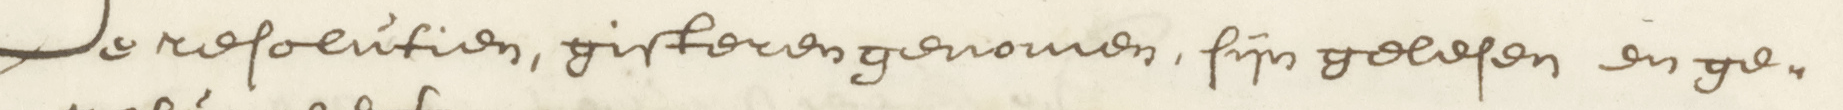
De resolutien, gisteren genomen, sijn gelesen en ge,,
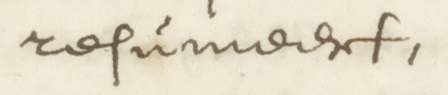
resumeert.
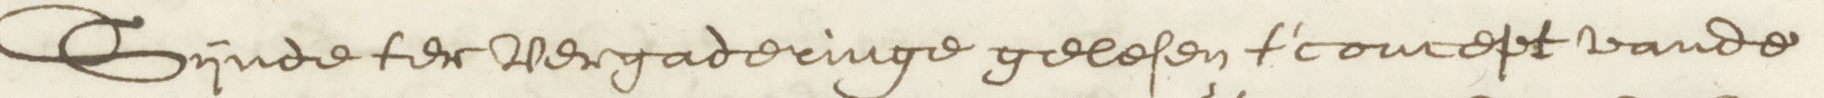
Sijnde ter Vergaderinge gelesen t'concept vande
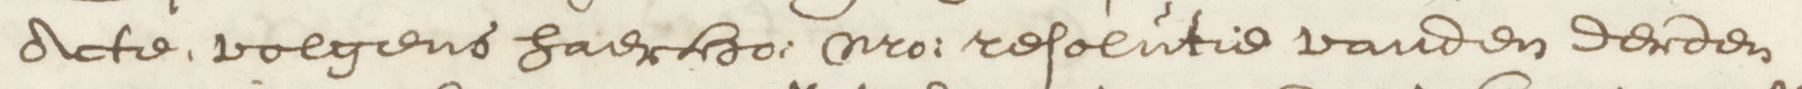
Acte, volgens haer Ho:Mo: resolutie vanden derden
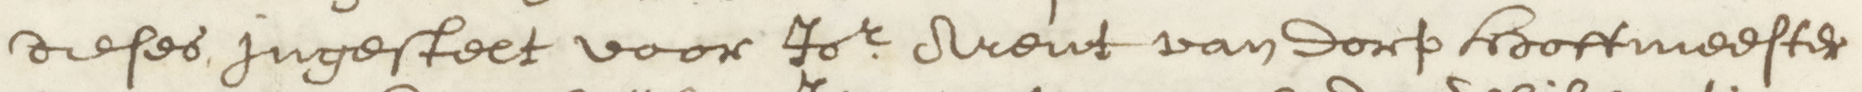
deses, ingestelt voor Jor Arent van Dorp Hoffmeester
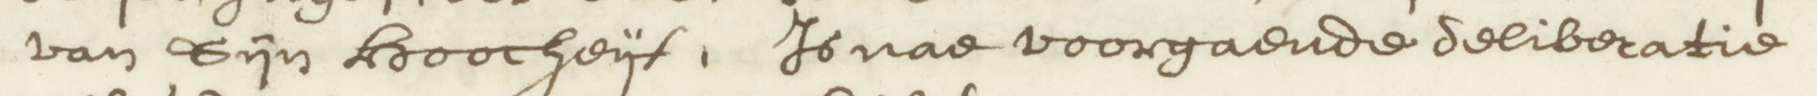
van Sijn Hoocheijt, Is nae voorgaende deliberatie
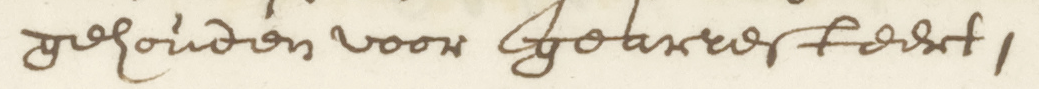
gehouden voor gearresteert.
